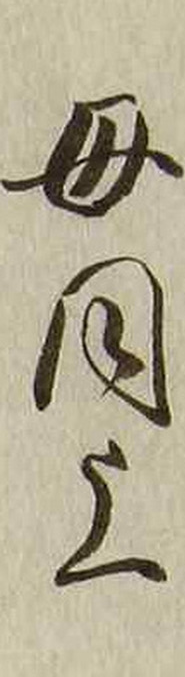母同上
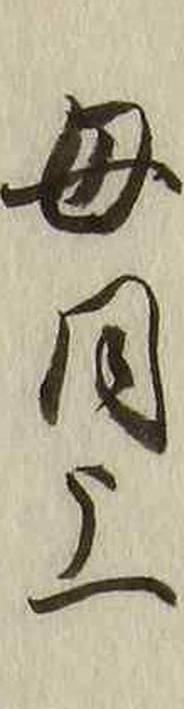母同上
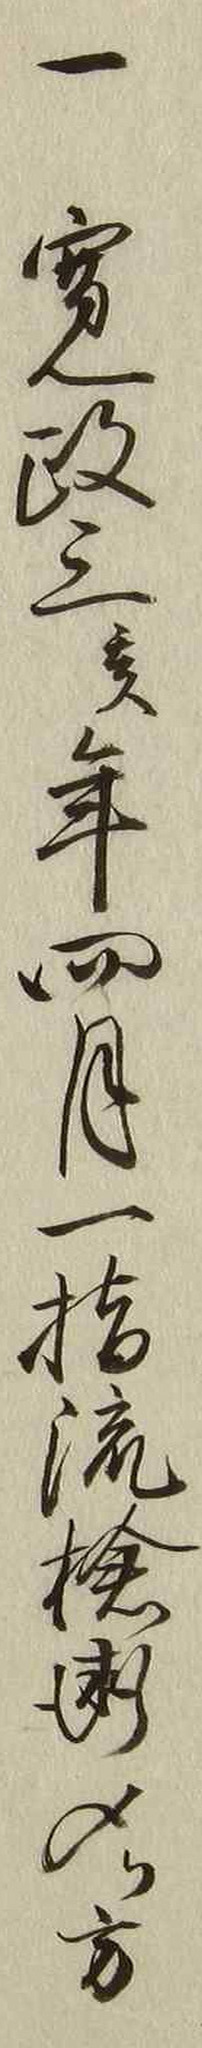一寛改三亥年四月一指流槍術〆リ方
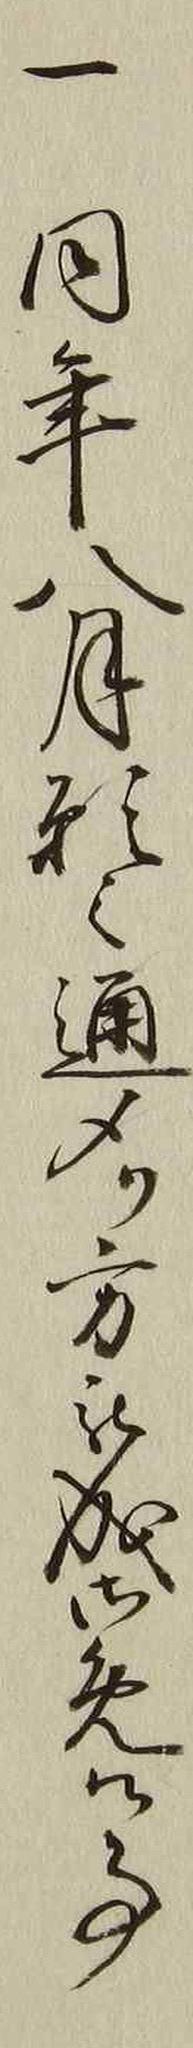一同年八月願之通〆り方被成御免候事
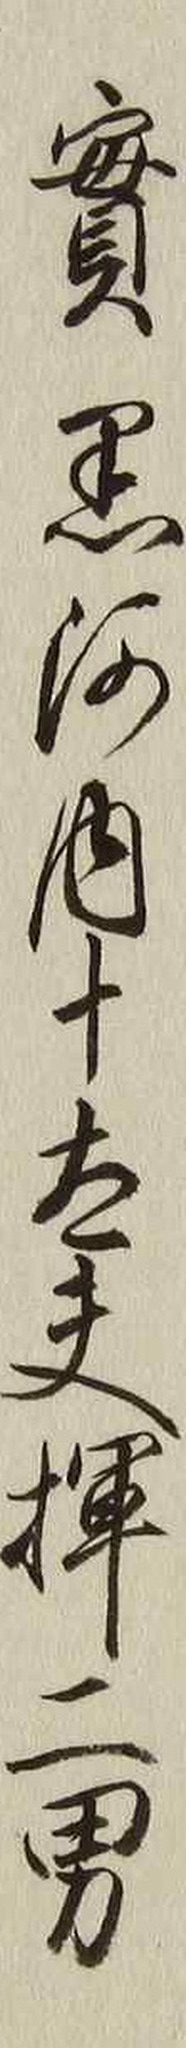実黒河内十太夫揮二男
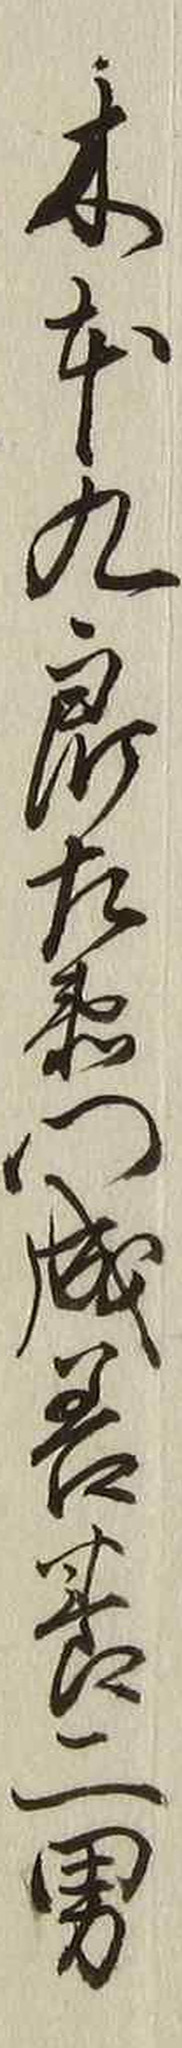木本九郎左衛門成善養二男
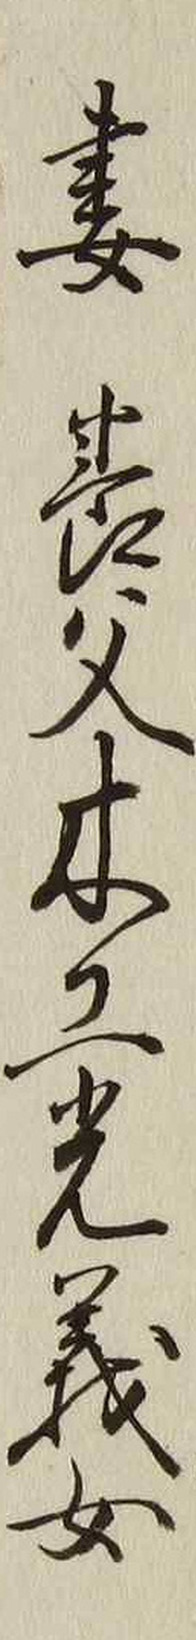妻養父木工光義女
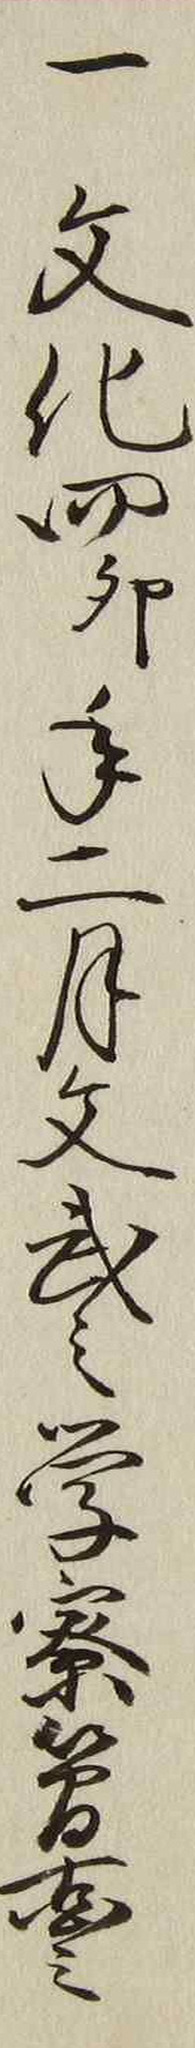一文化四卯年二月文武之学寮簡固之
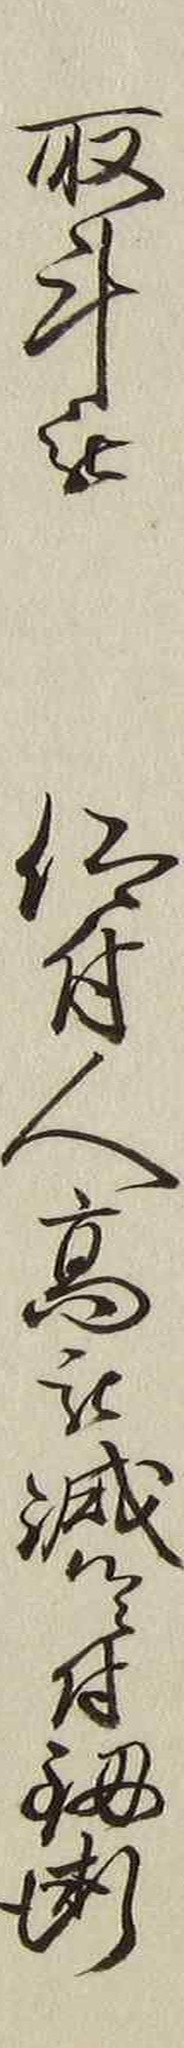取斗被仰付人高被減候ニ付劔術
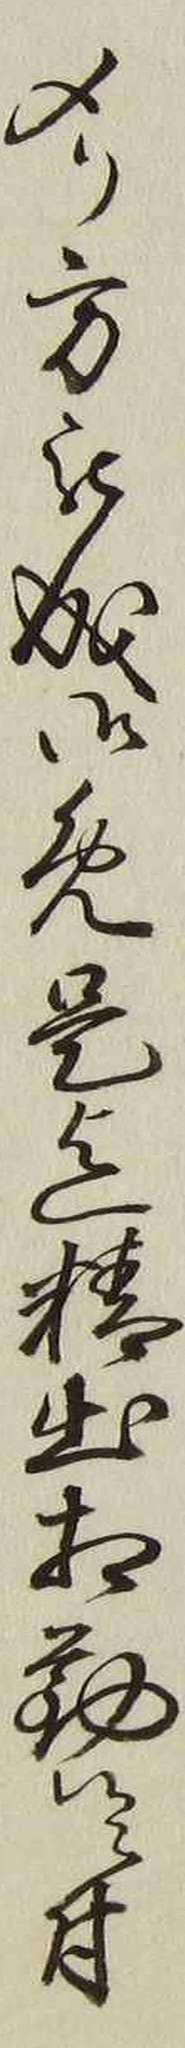〆り方被成御免是迄精出相勤候ニ付
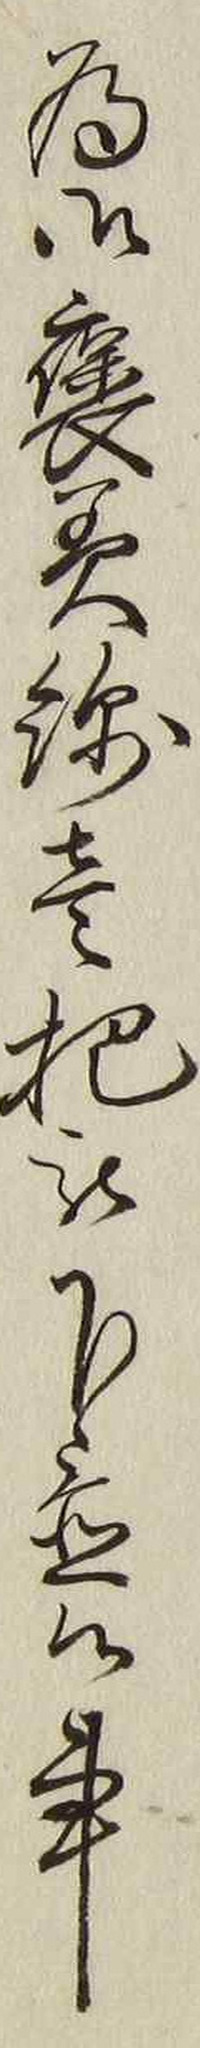為御褒美綿壱把被下置候事
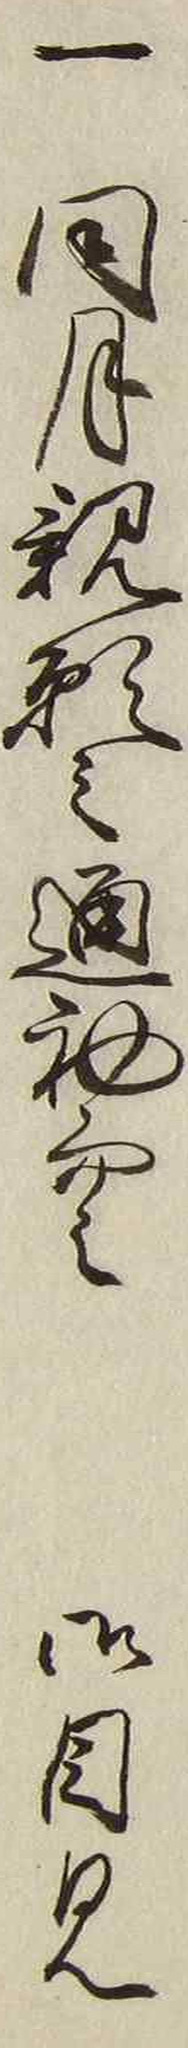一同月親願之通初而之御目見

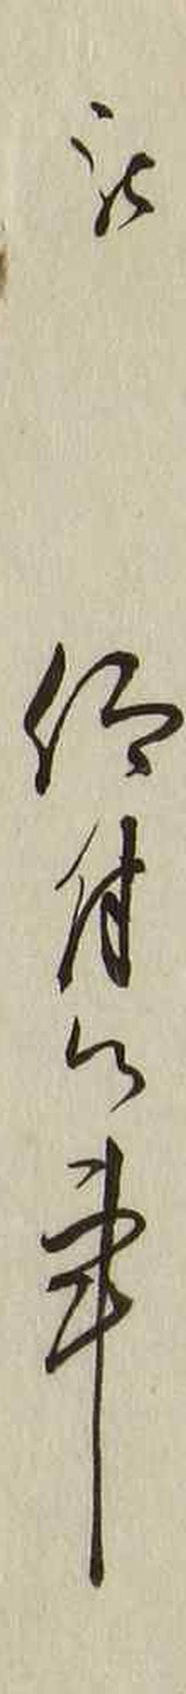被仰付候事
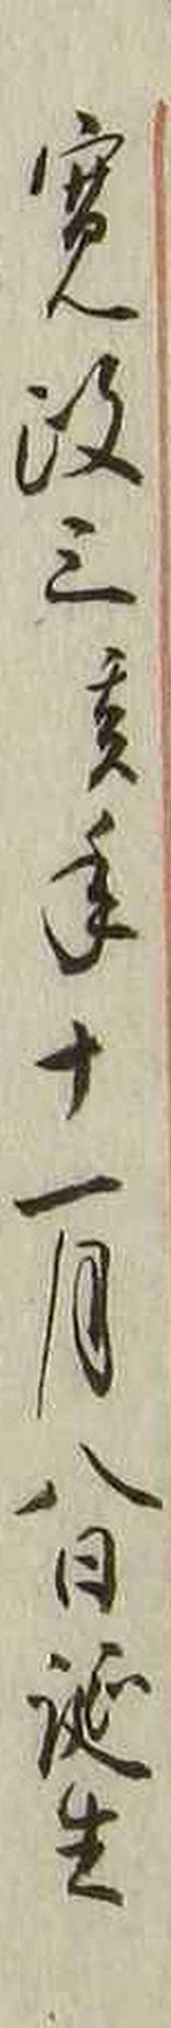寛政三亥年十一月八日誕生
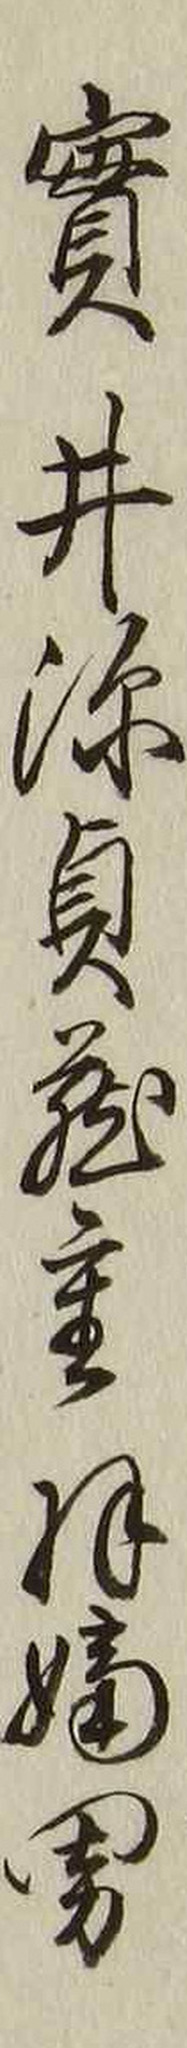実井深貞蔵重羽嫡男
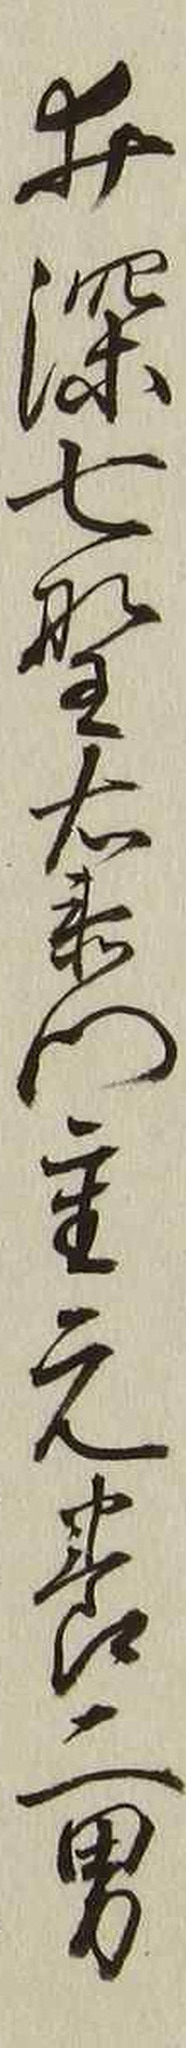井深七野右衛門重元養二男
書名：諸士系譜　巻之21　い之部21
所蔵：会津若松市立会津図書館
